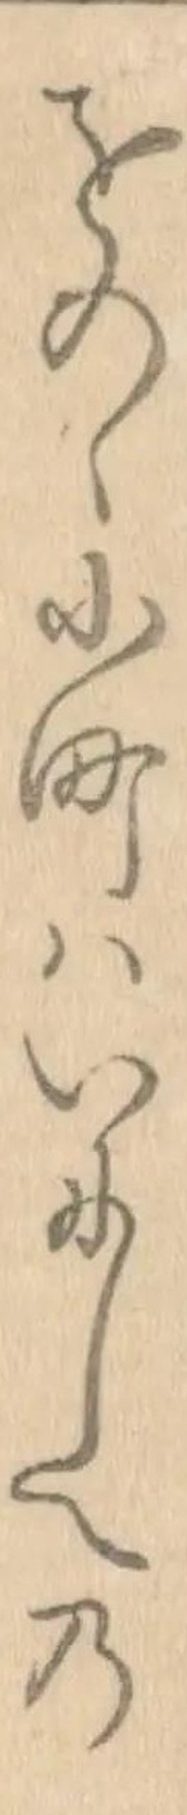をのゝ小町はいにしへの
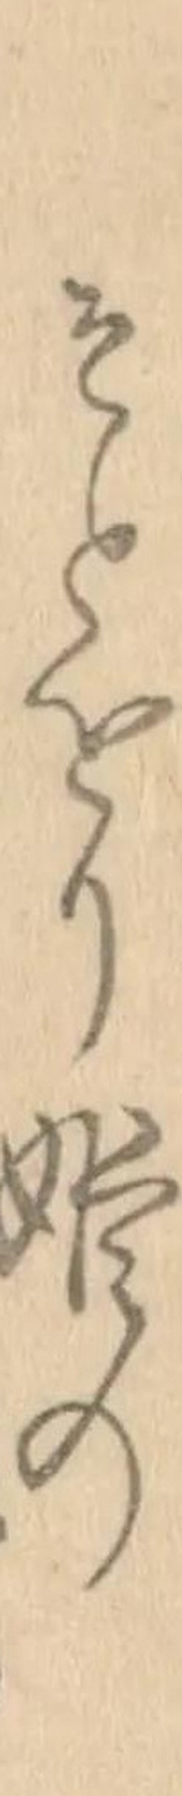そとをり姫の
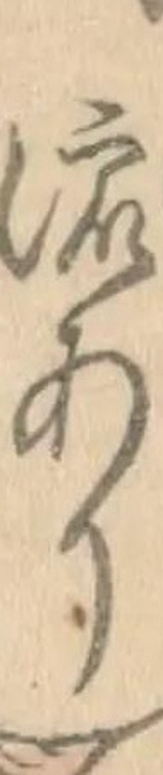流あり
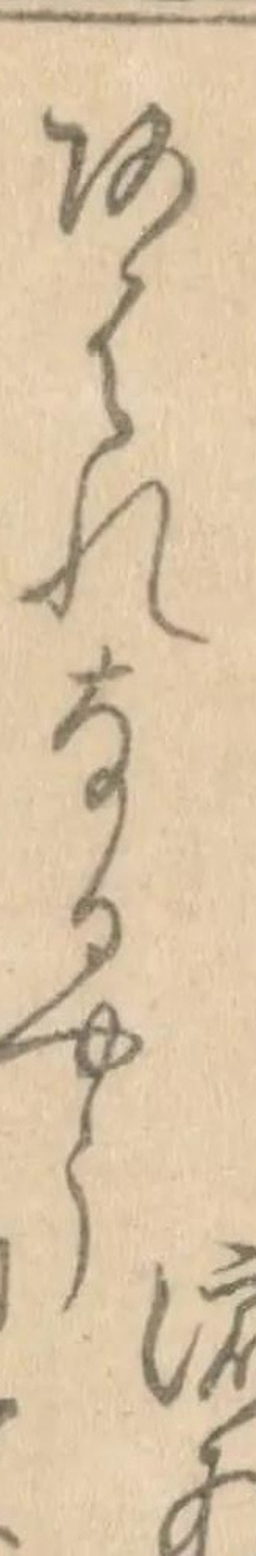あはれなるやうにて
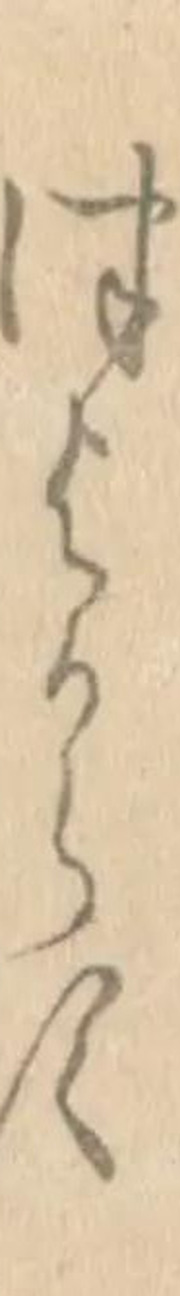つよからす
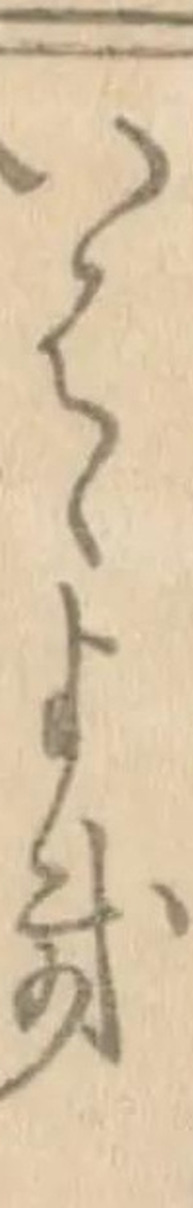いはゝよき
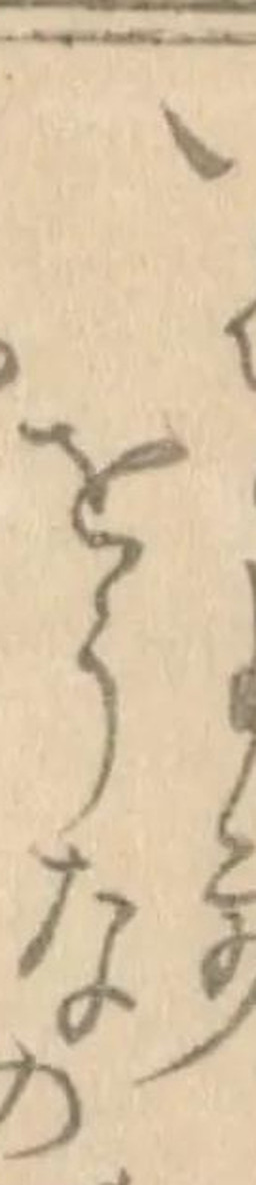をうなの
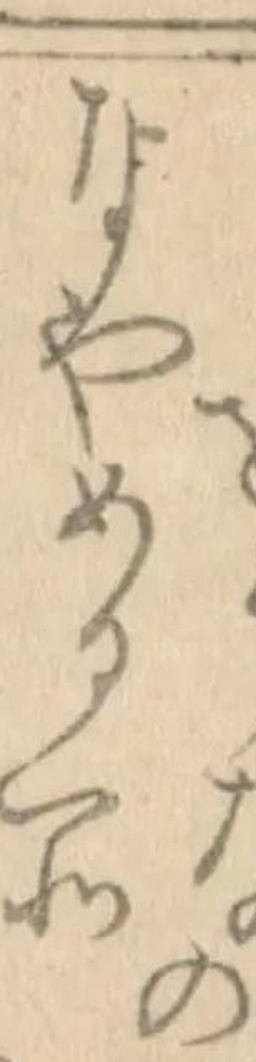なやめる所
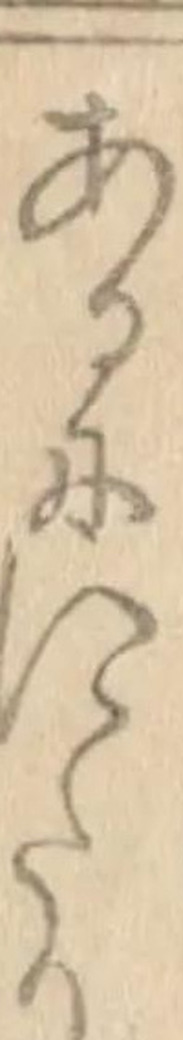あるににたり
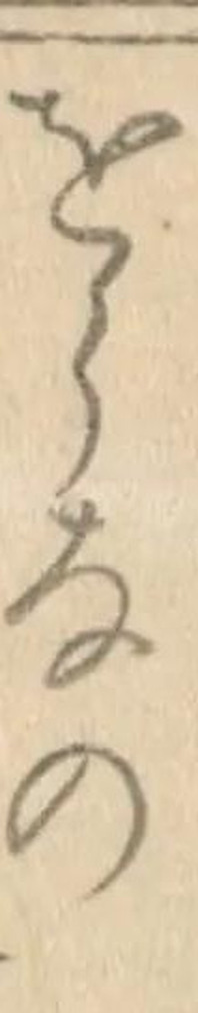をうなの
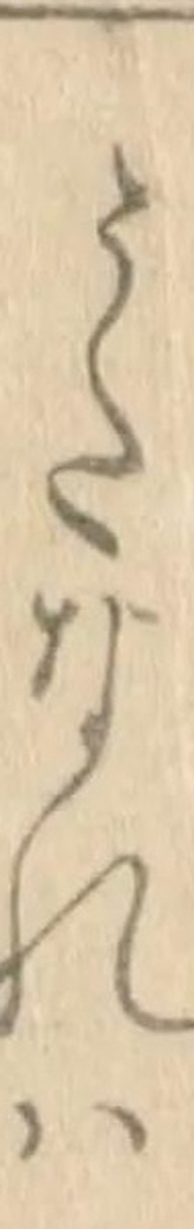うたなれは
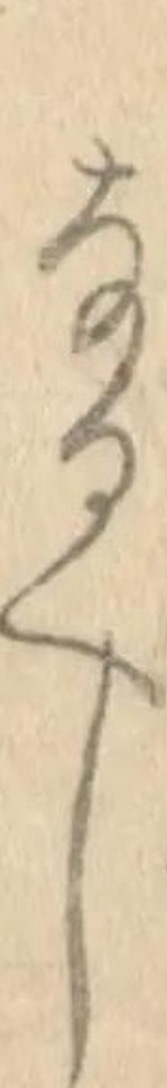なるへし
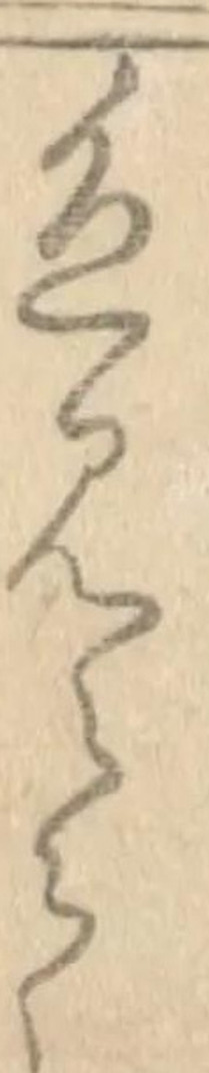色見えて
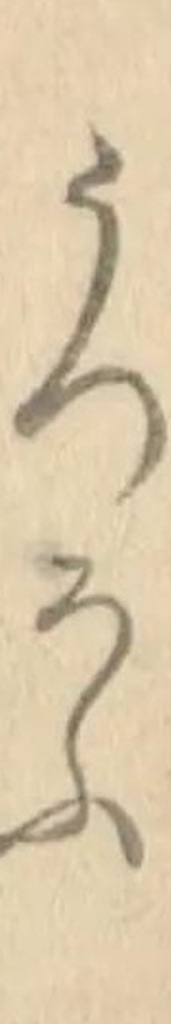うつろふ
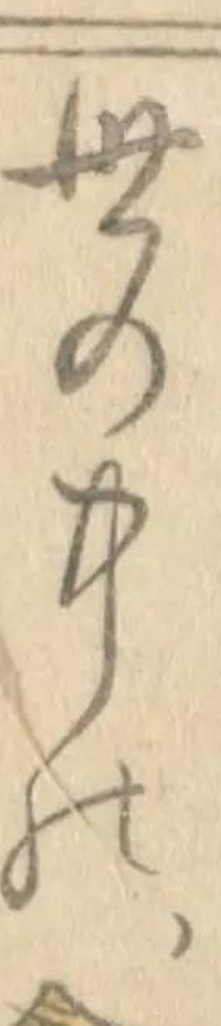世の中の
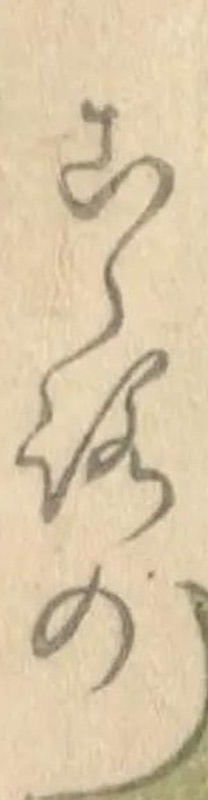こゝろの
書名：錦百人一首あつま織
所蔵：国立国会図書館 National Diet Library, JAPAN
